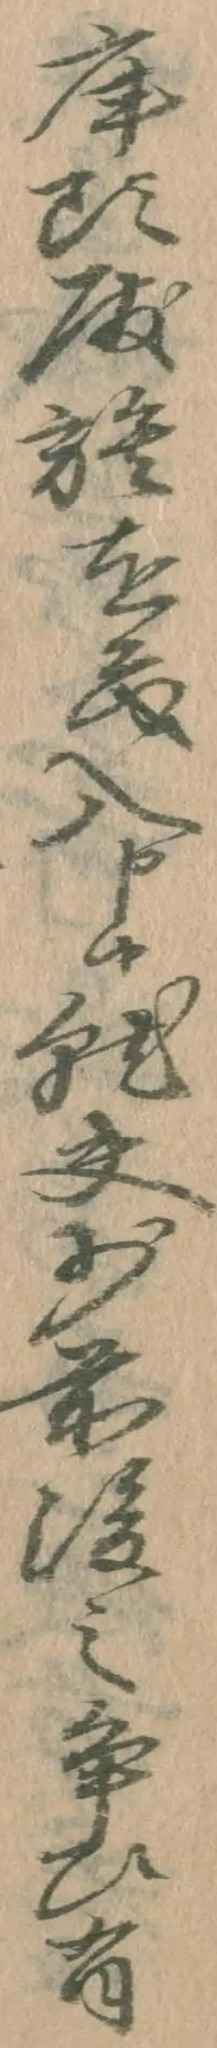庫頭殿旗を茂入申候就夫少前後之争ひ有
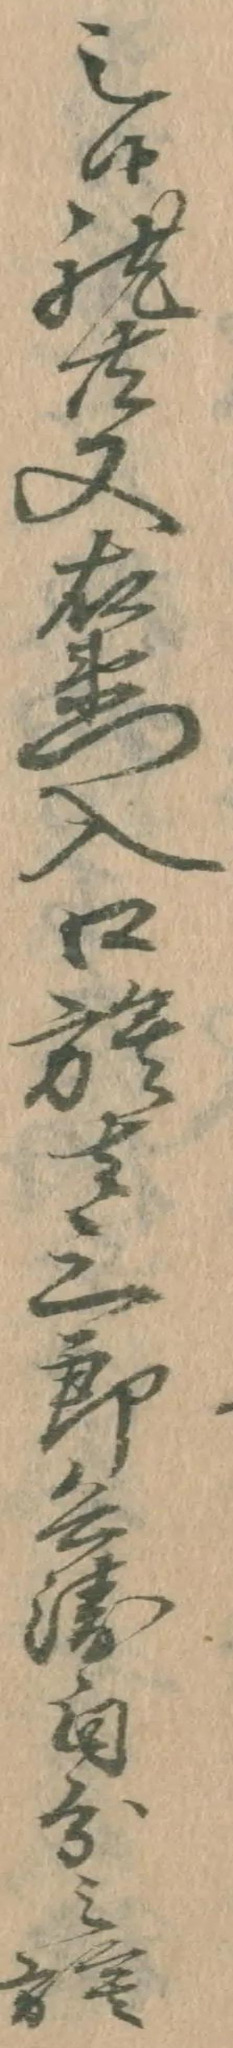之候然共又右衛門入口旗者三郎兵衛自分之旗
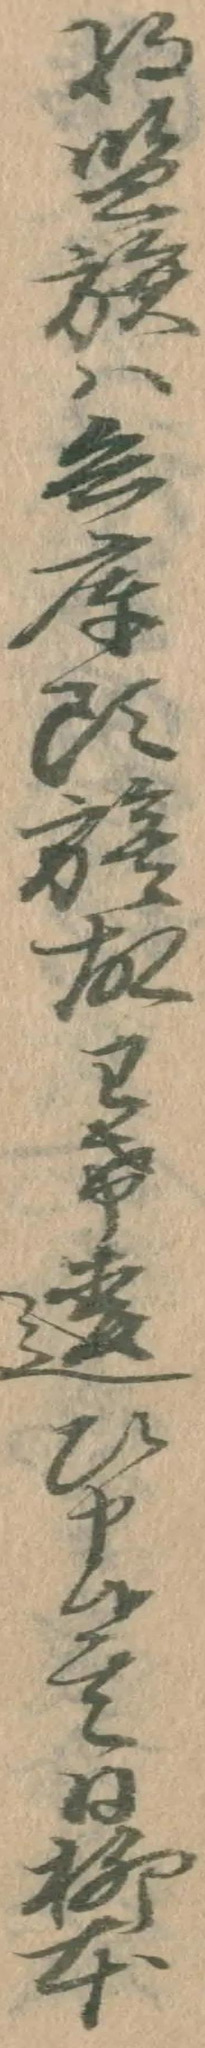将監旗は兵庫頭旗故已希違ひ申候其日柳本
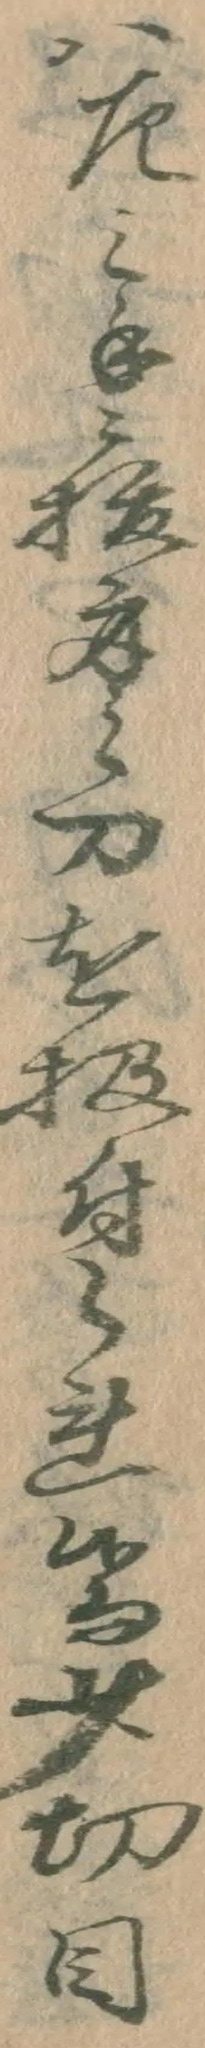は左之手に抜身之刀を扱付ら連候而少切目
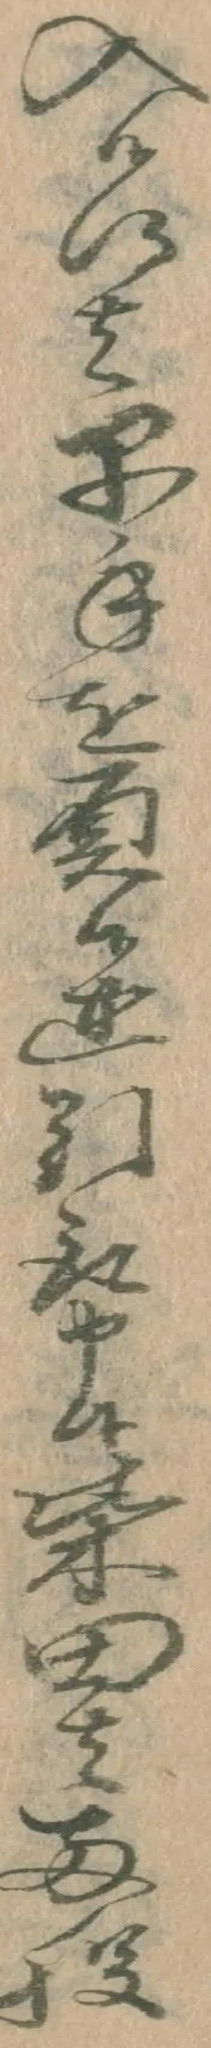入候得者早手を負候迚引取申候柴田者両股
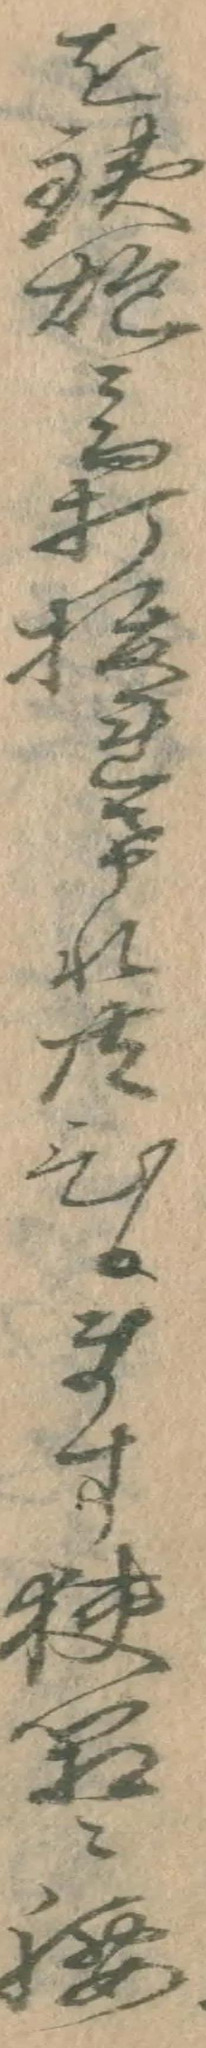を鉄砲に而打抜連希れ共飛るます狭箱に腰
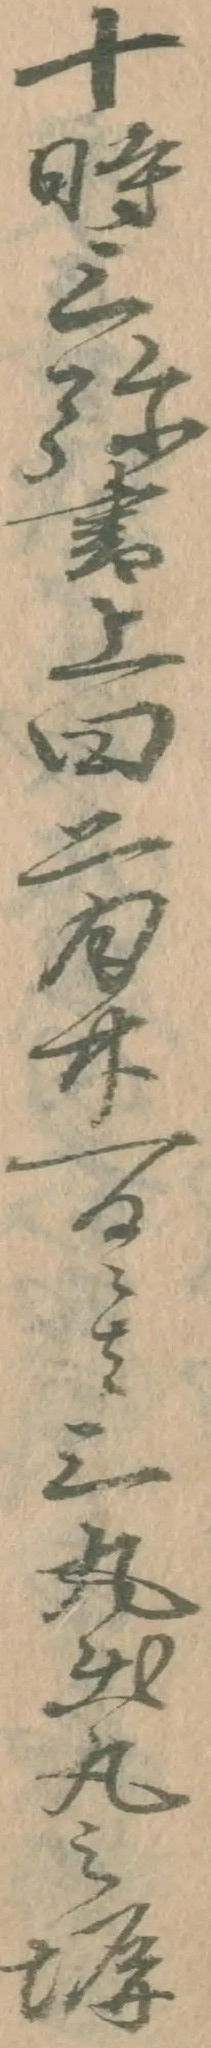十時三弥書上曰二月廿一日に者三丸出丸之塀

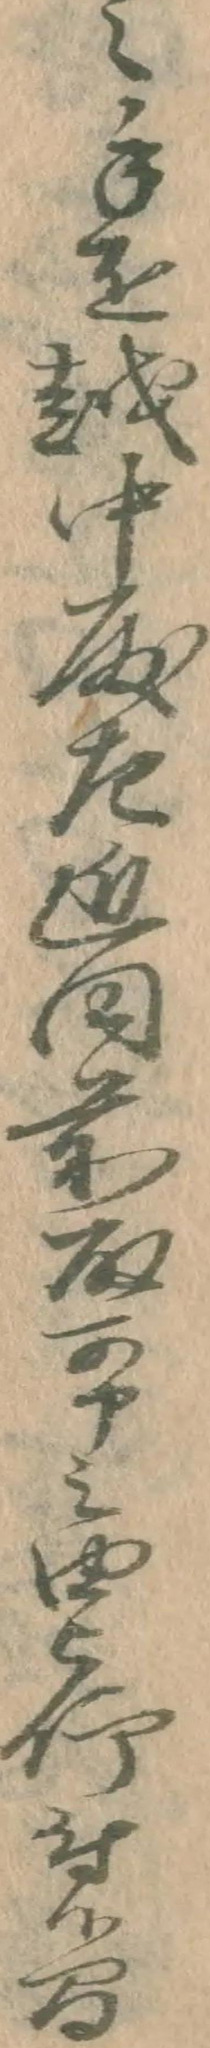之手を越中殿左近同前故可申之由被仰付候間
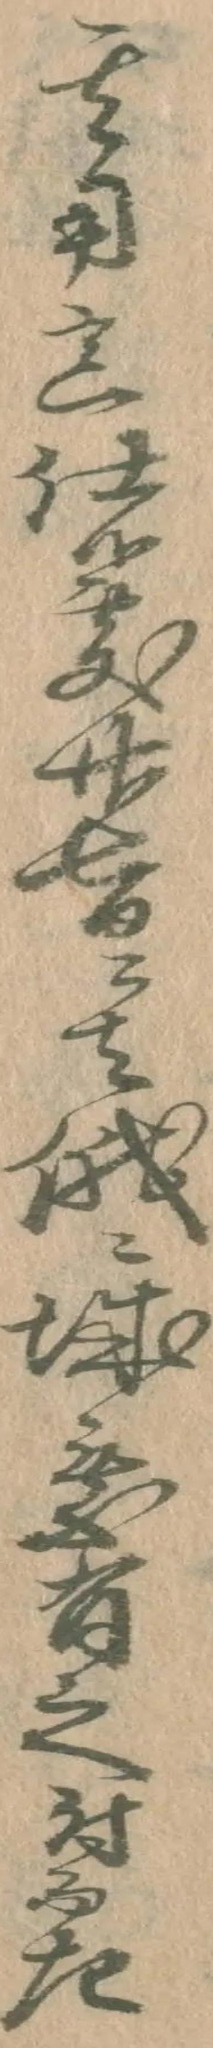其用意仕候處廿七日に者俄に城乗有之付而左
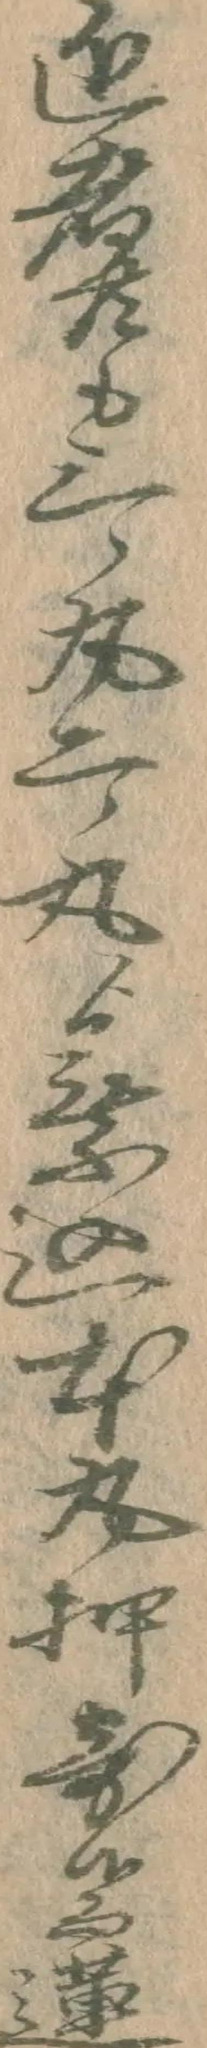近者共も三之丸二之丸ゟ乗込本丸押寄候而蓮
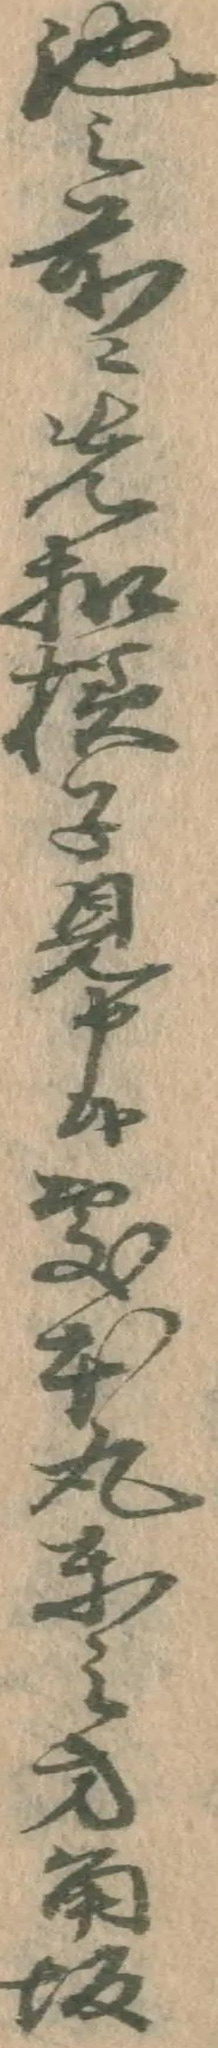池之前に先扣様子見申候處本丸東之方角坂
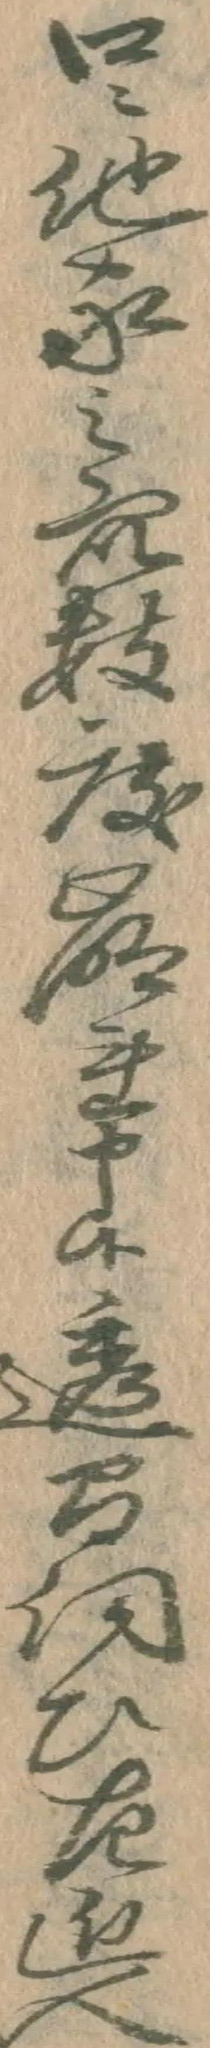口に他家之衆数度崩連申候透間伺ひ左近人
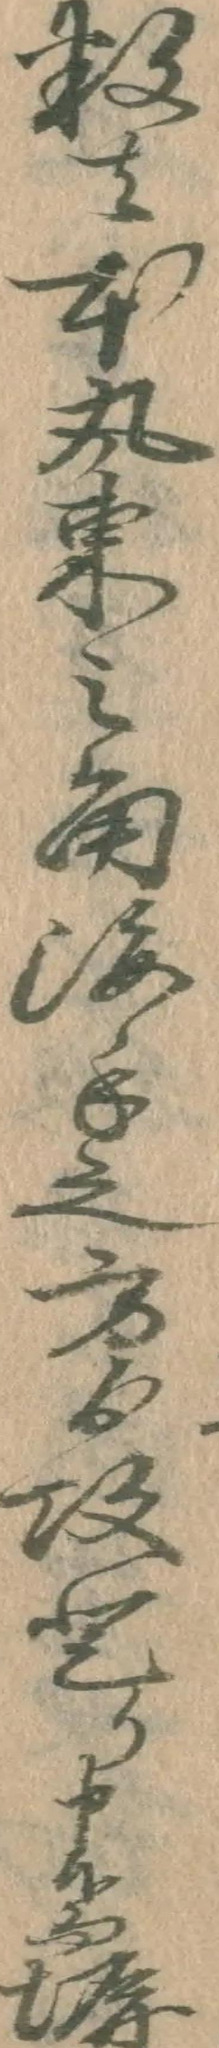数者本丸東之角海手之方ゟ攻登り申候而塀
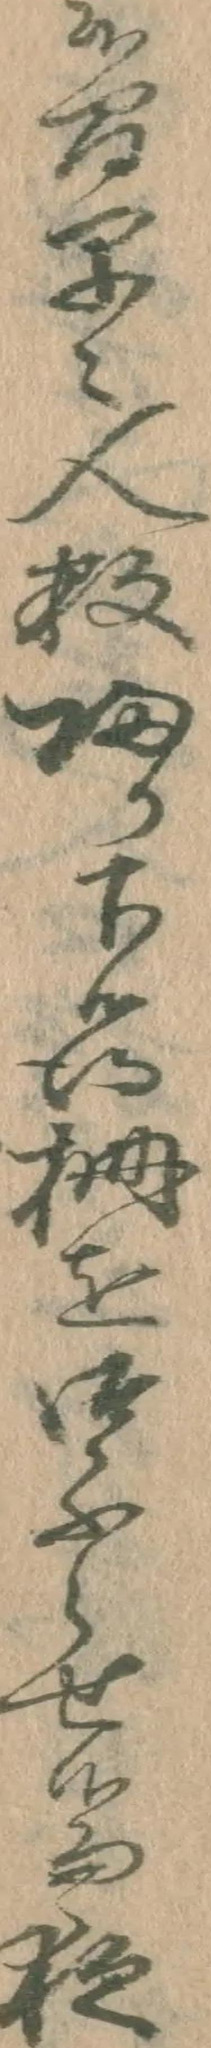候間早々人数帰り下候得柵を御ふらせ候而夜
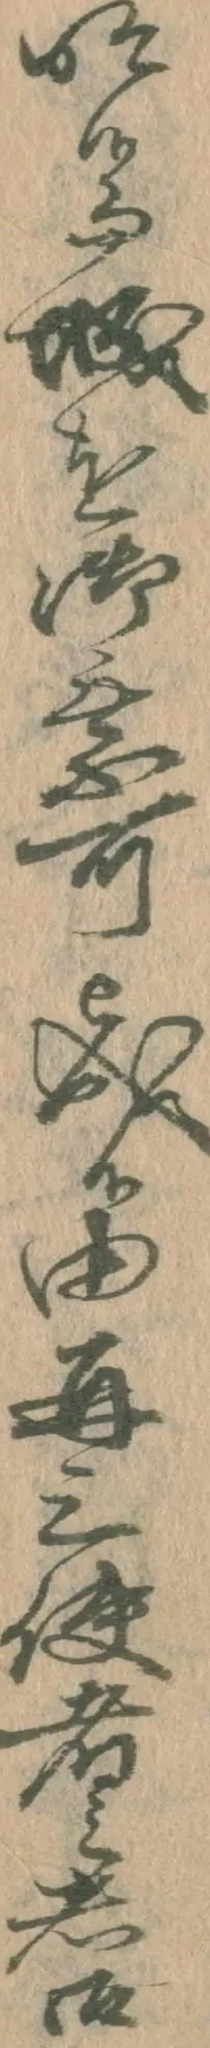明候而城を御乗可被成候由再三使者之者御
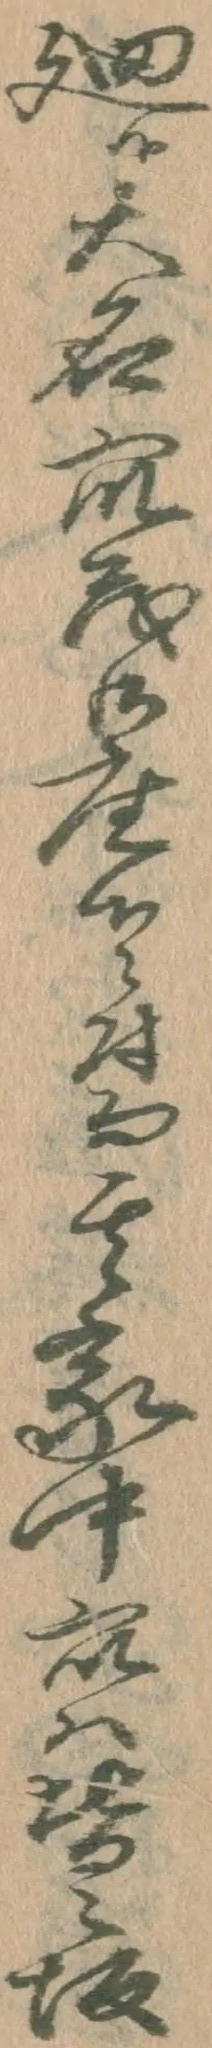廻候大名衆茂御座候に付而其家中衆は皆々坂
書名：切支丹御退治記 49巻. [8]
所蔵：国立国会図書館 National Diet Library, JAPAN
